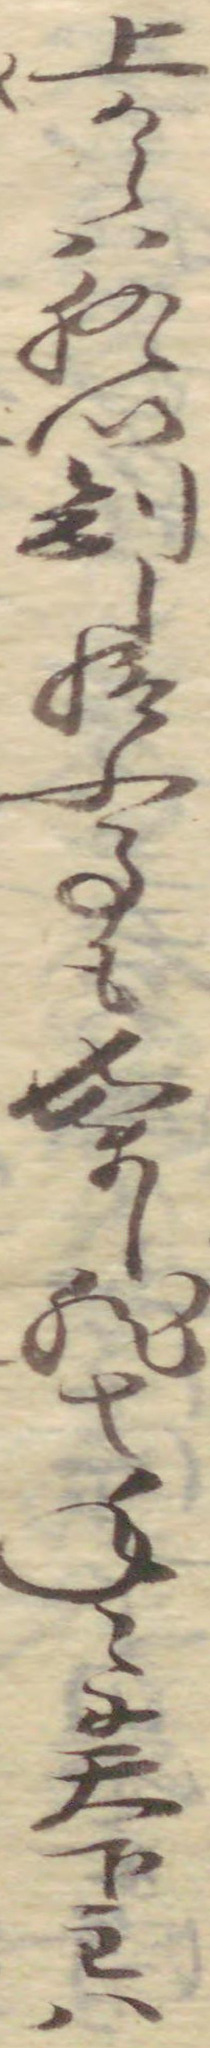上からは猶以制し給ふ事も成まし然は年〻に天下主は
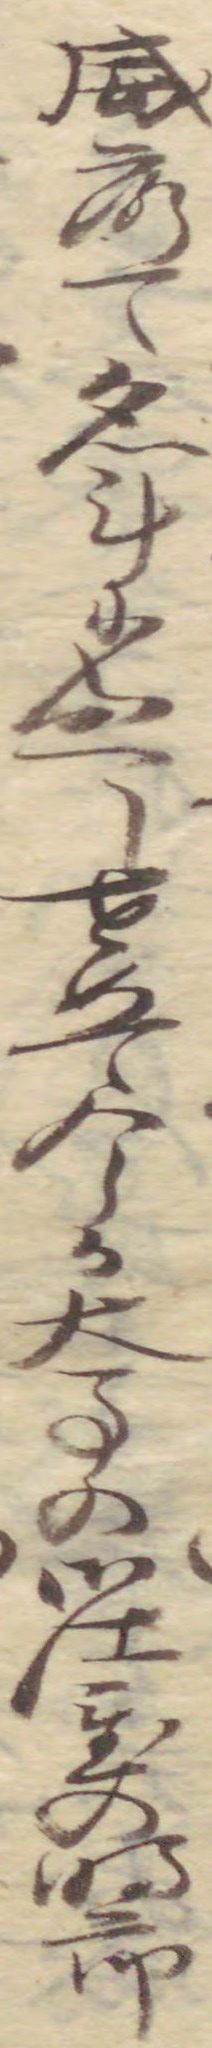威落て名計に成へしせめて今か大事の御仕置の時節
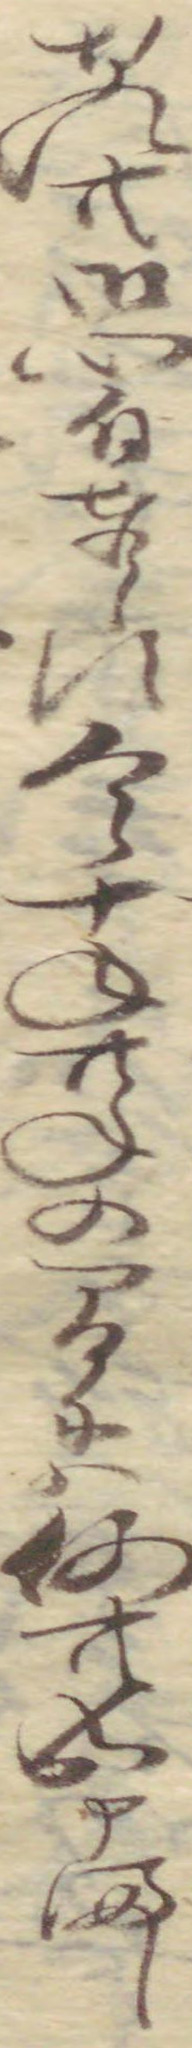なれ共御心付奉らす今十年廿年の間には何共成申まし
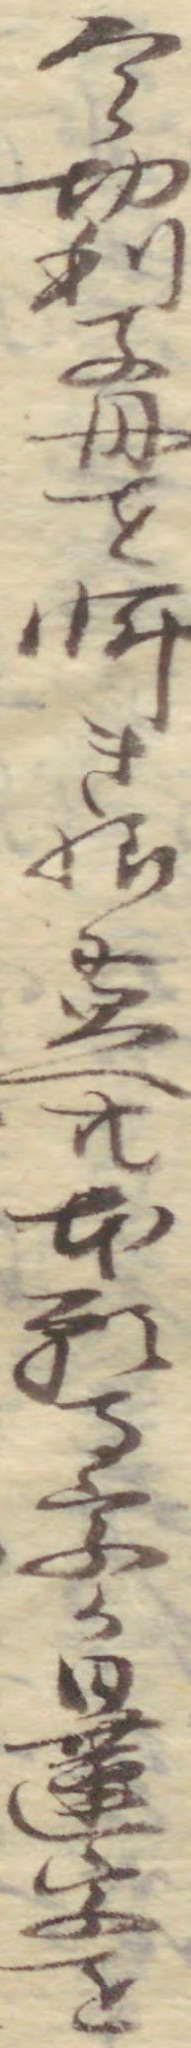今切利支丹を怖き様に思へ共本願寺宗か日蓮宗を
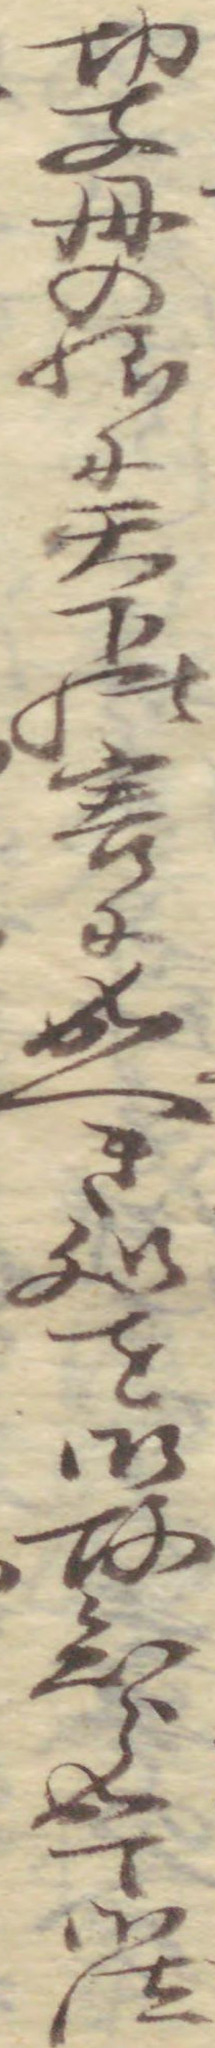切支丹の様に天下の害に成へき処を御存知被成て御法
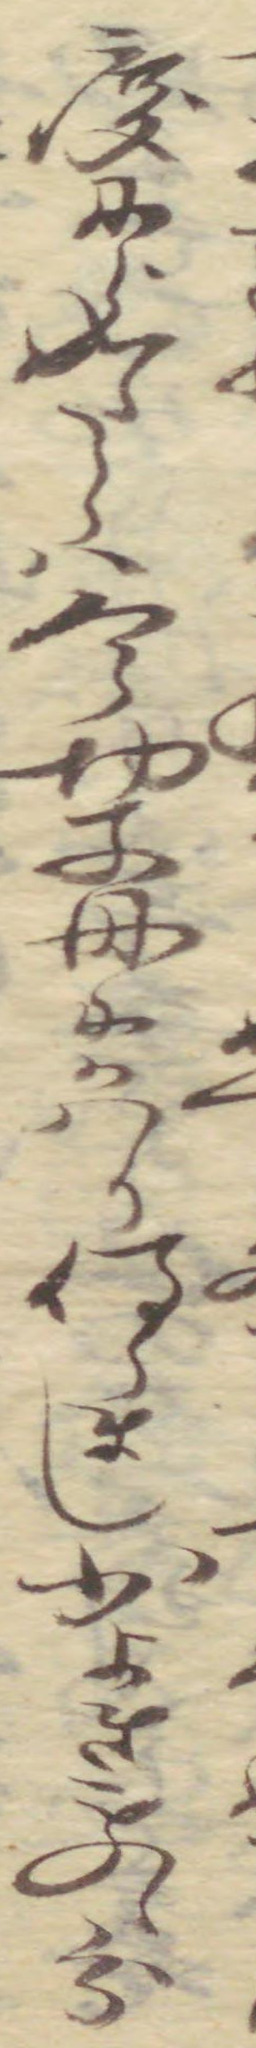度に被成たらは今切支丹にかはり侍るまし少よきものゝ分
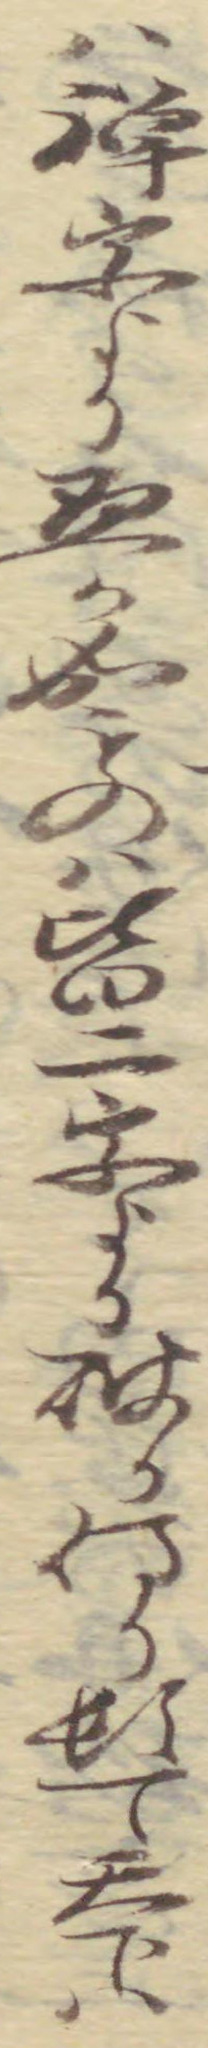は禅宗より愚か成ものは皆二宗より破り侍り頓て天下は
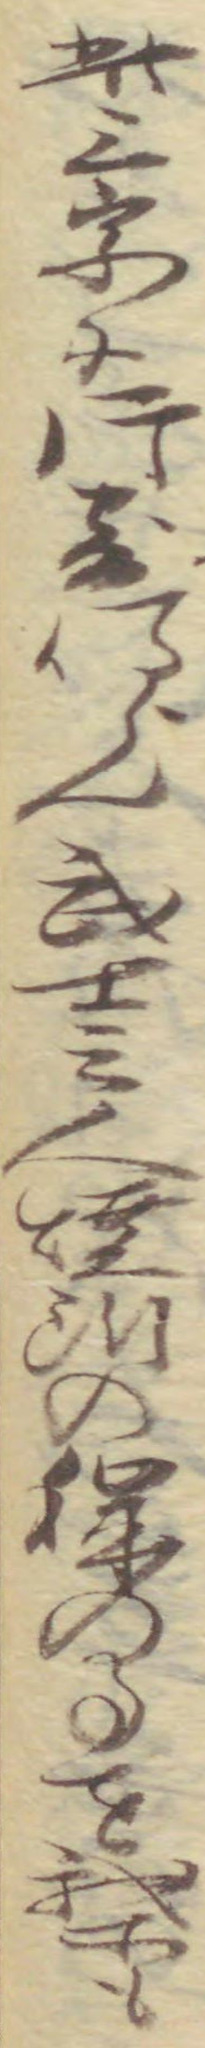此三宗に片寄侍らん武士云人焼所の穢の事を我等も
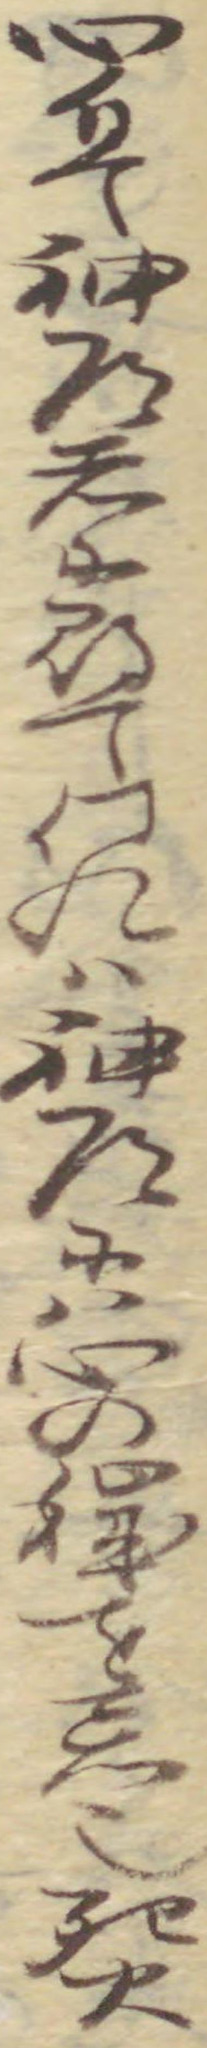心付て神道者に尋て侍れは神道には心の穢を忌也死火
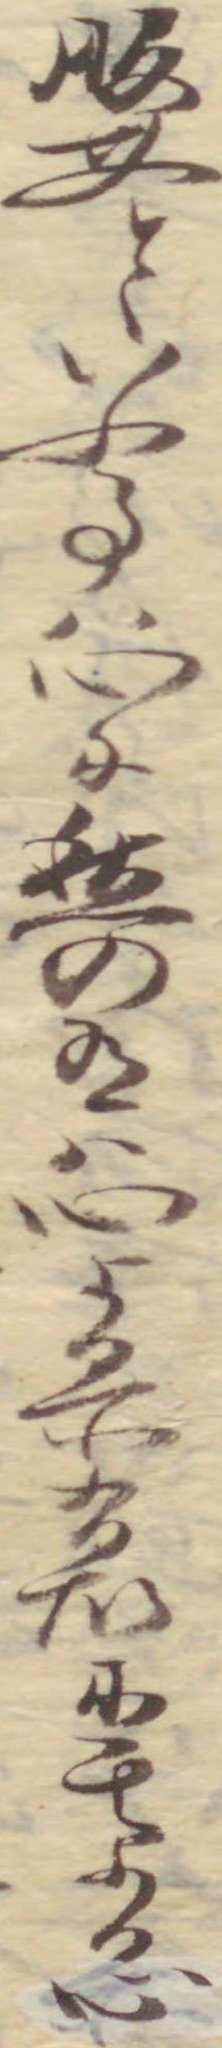服なといふ事は心に愁の有は心よる所有故に其よる心
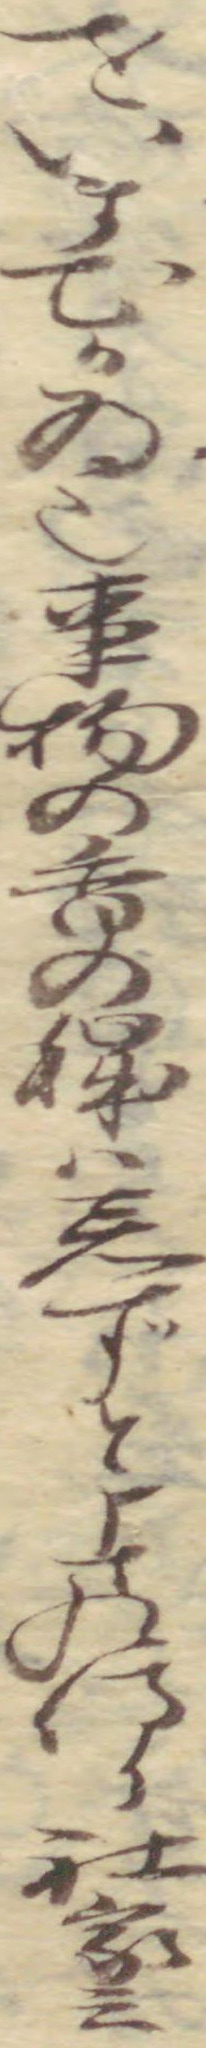をいまむか為也事物の香の穢は忌ずと申され侍り社家云
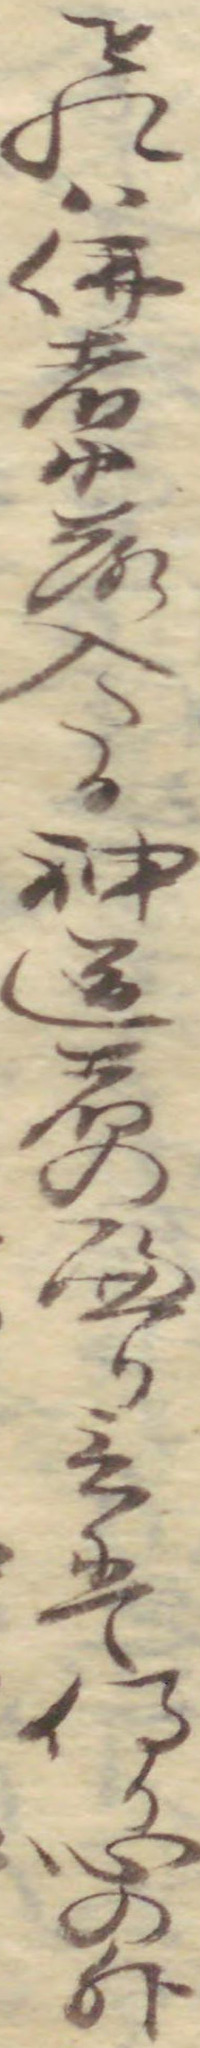それは仏者に落入たる神道者のへか言にて侍り心の外
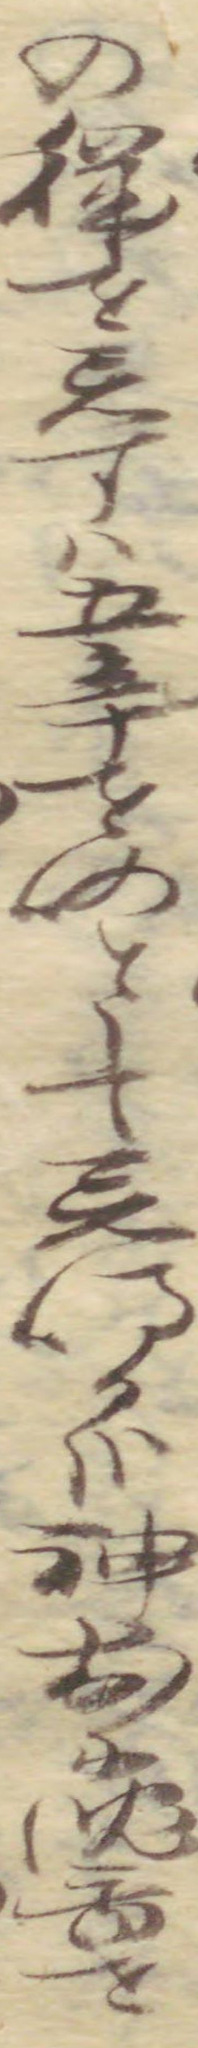の穢を忌すは五辛を何として忌侍る哉神前に沈香を
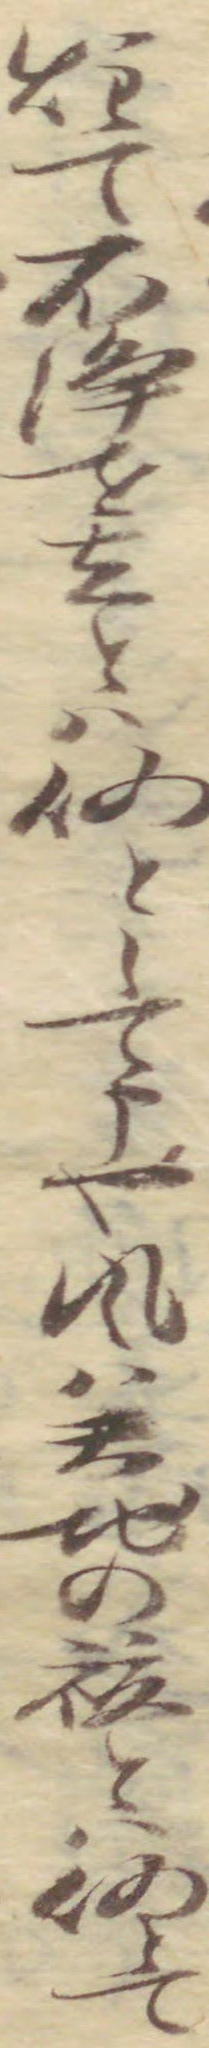炷て不浄を去とは何として申や風は天地の祓とは何とて
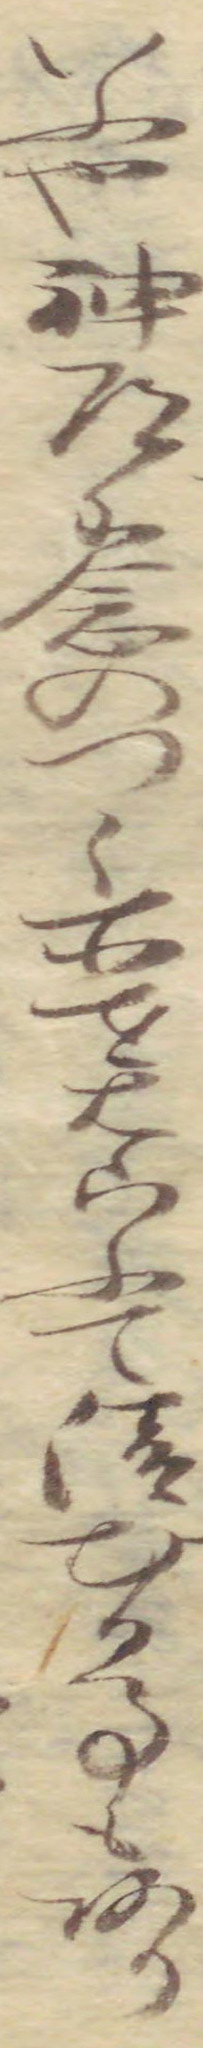いふや神道に念のつく所をはらふて清むる事もあり
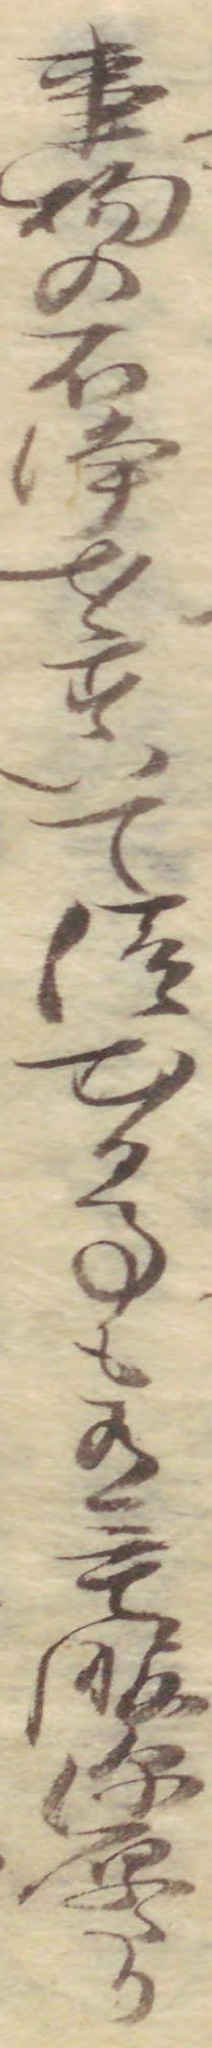事物の不浄をすいて清むる事も有重服深厚たり
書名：鶯宿雑記. 巻263-264
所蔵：国立国会図書館 National Diet Library, JAPAN
